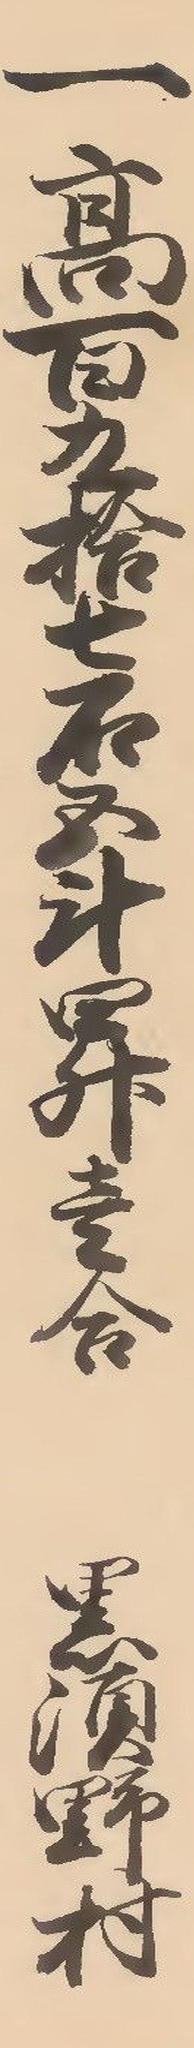一高百九拾七石五斗四升壱合黒須野村
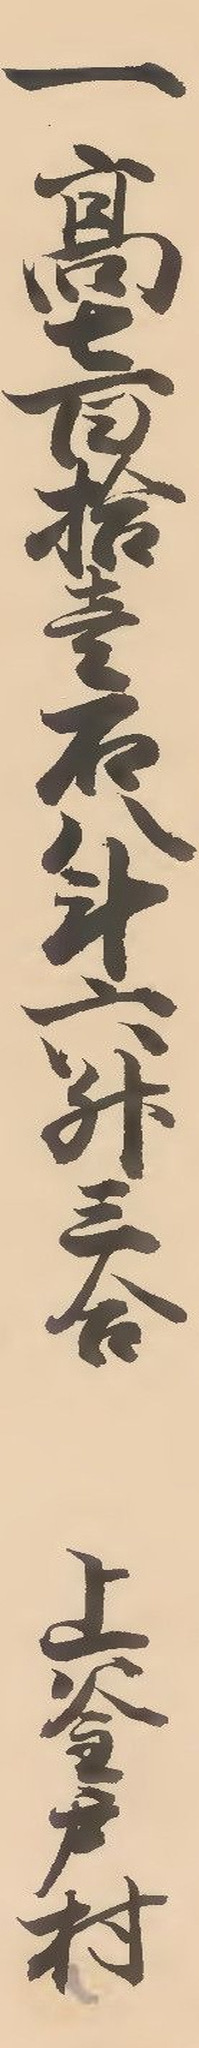一高七百拾壱石八斗六升三合上釜戸村
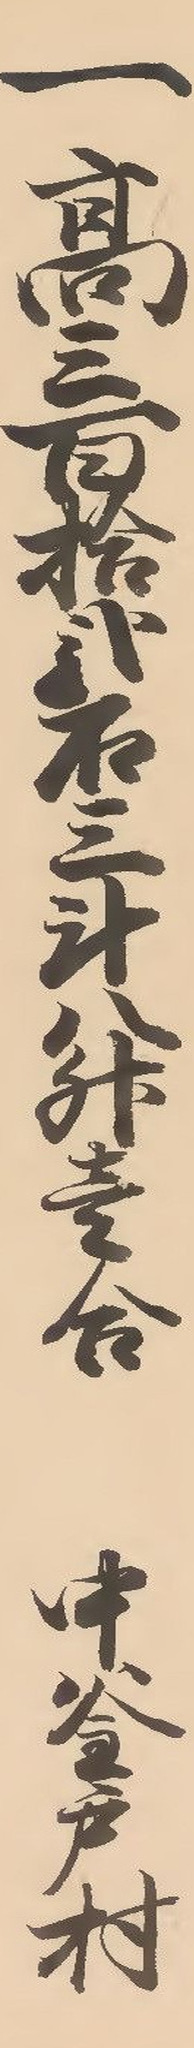一高三百拾弐石三斗八升壱合中釜戸村
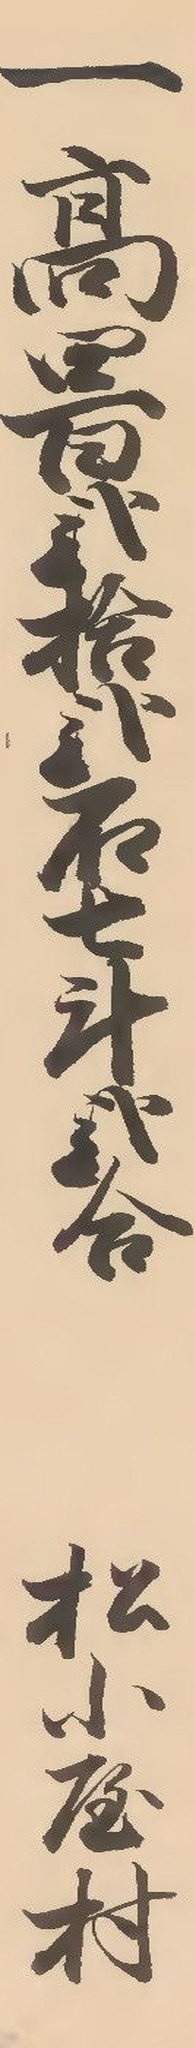一高四百弐拾弐石七斗弐合松小屋村
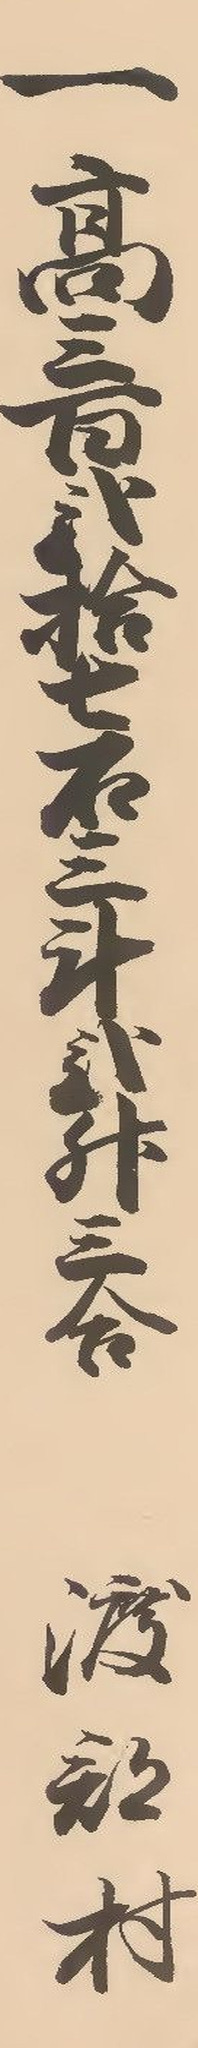一高三百弐拾七石三斗弐升三合渡部村
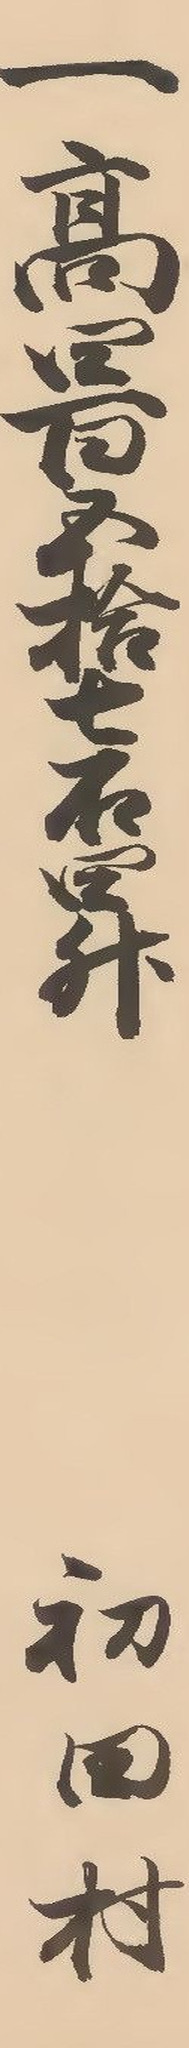一高四百五拾七石四升初田村
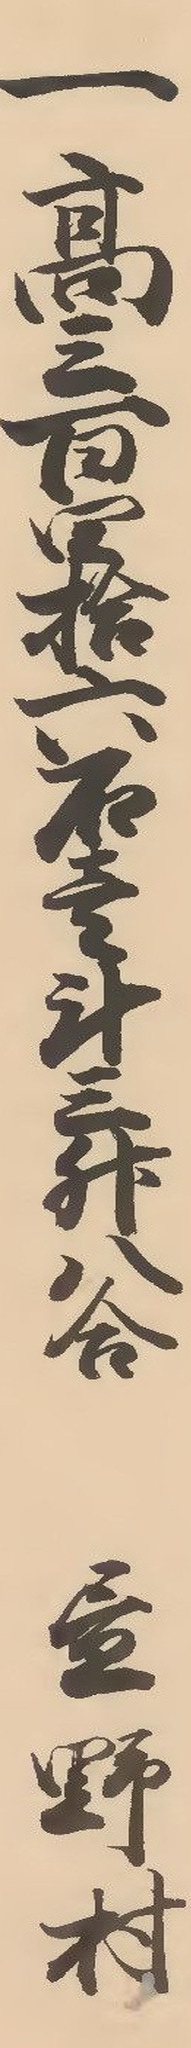一高三百四拾六石壱斗三升八合昼野村
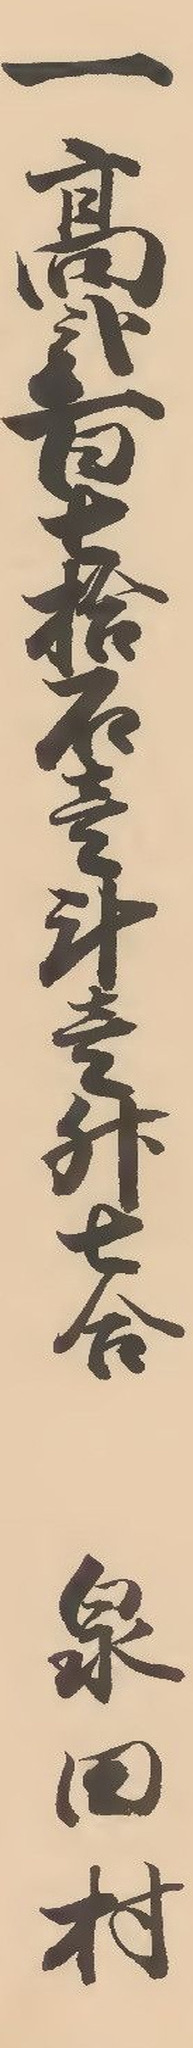一高弐百七拾石壱斗壱升七合泉田村

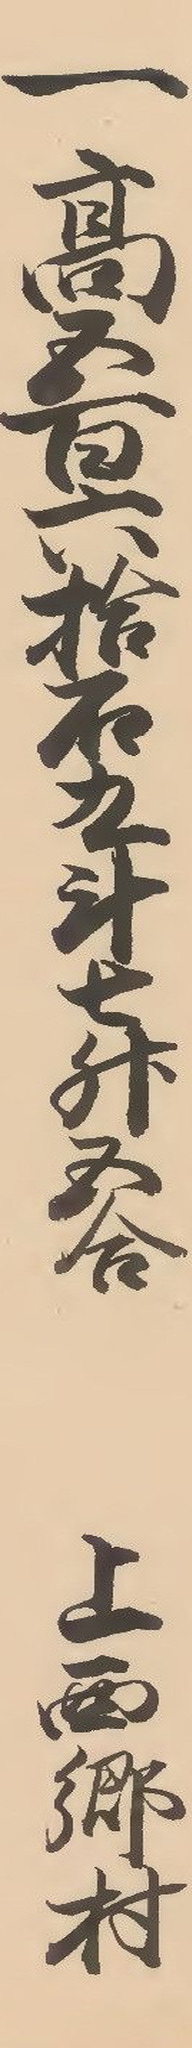一高五百六拾石九斗七升五合上西郷村
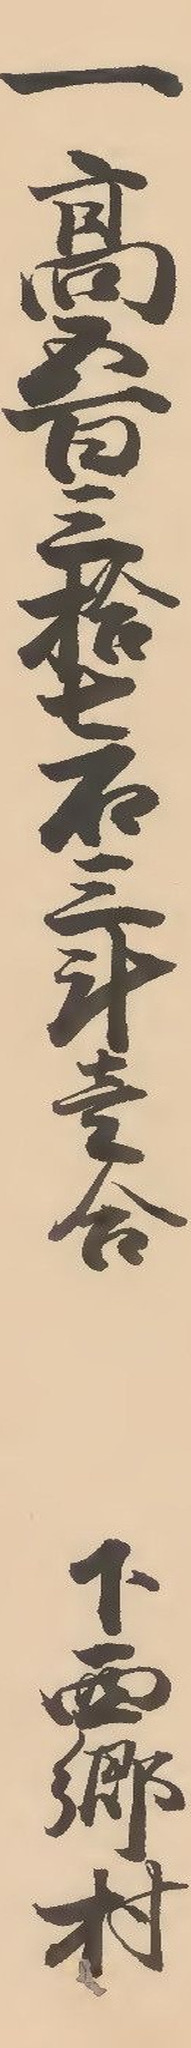一高五百三拾七石三斗壱合下西郷村
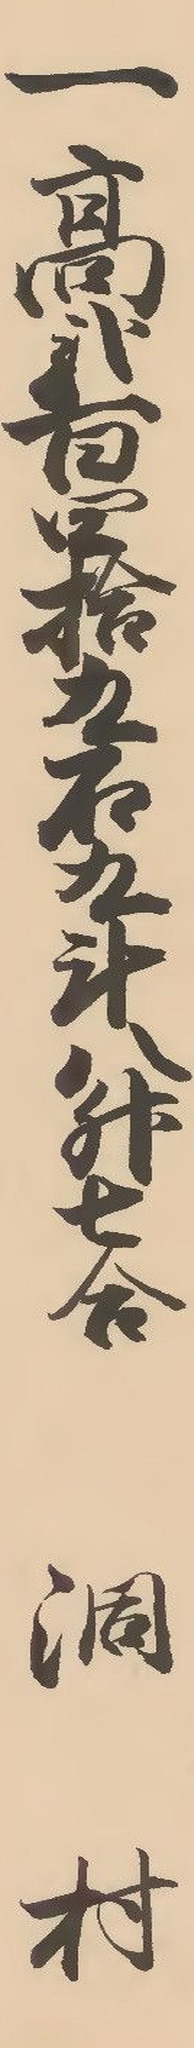一高弐百四拾九石九斗八升七合洞村
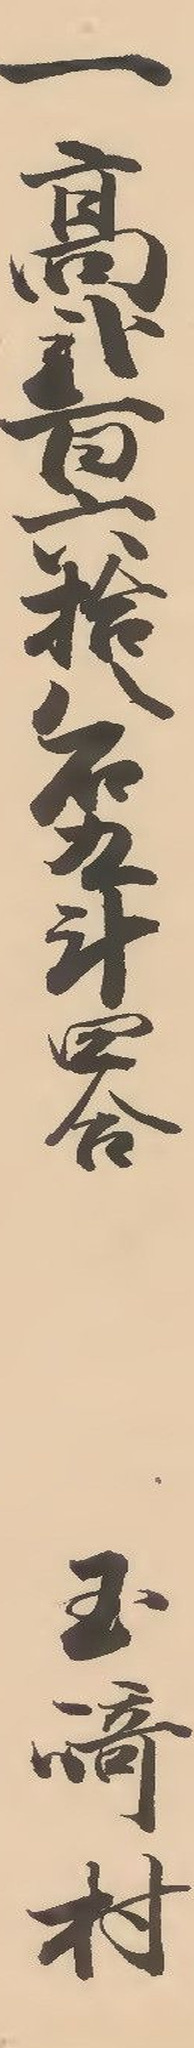一高弐百六拾八石九斗四合玉崎村
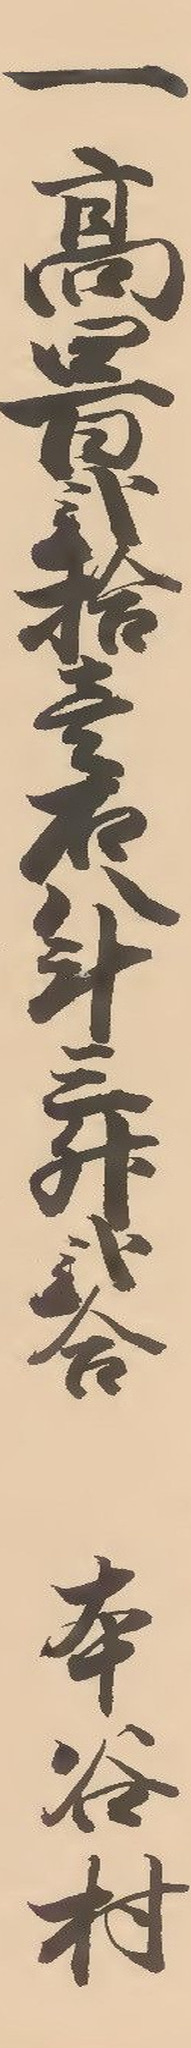一高四百弐拾壱石斗八斗三升弐合本谷村
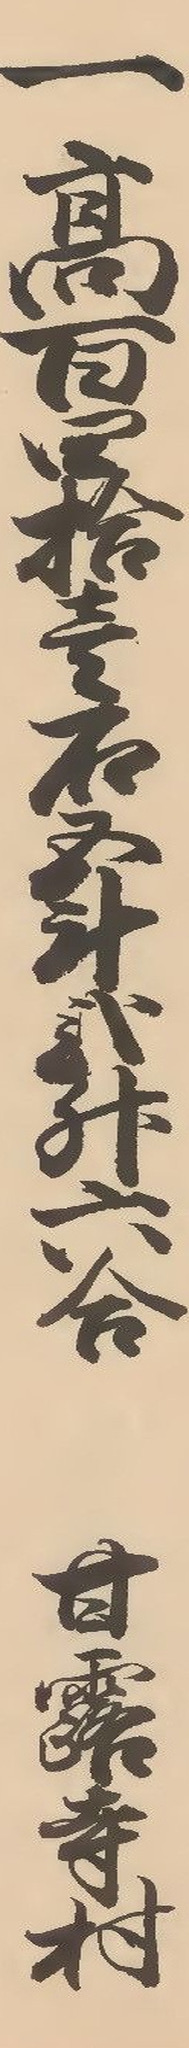一高百四拾壱石五斗弐升六合甘露寺村
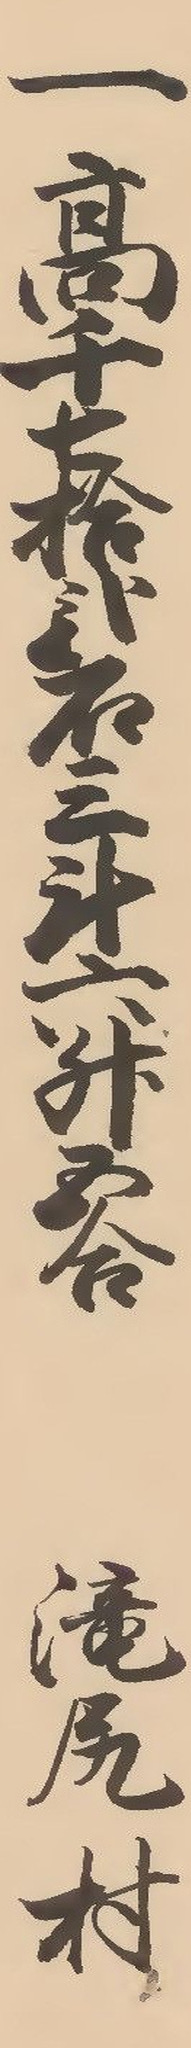一高千七拾弐石三斗六升五合滝尻村
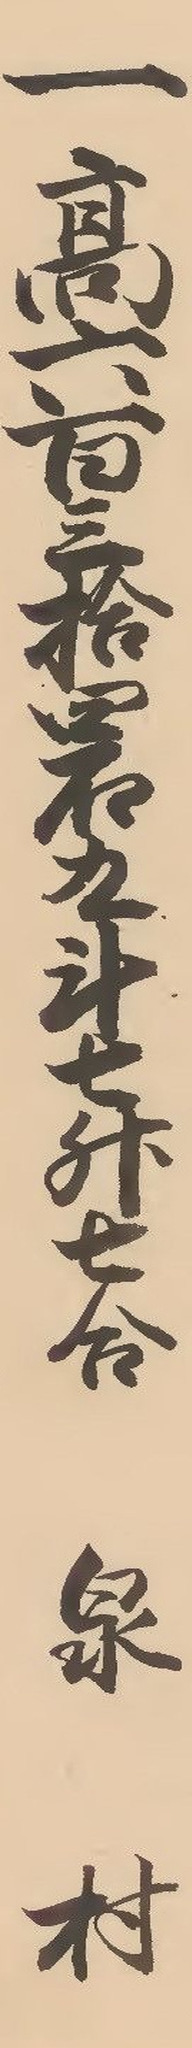一高六百三拾四石九斗七升七合泉村
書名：陸奥国郷帳　３
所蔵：国立公文書館 National Archives of Japan
